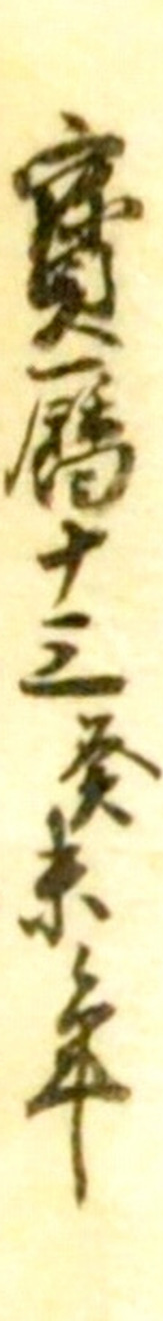宝暦十三癸未年

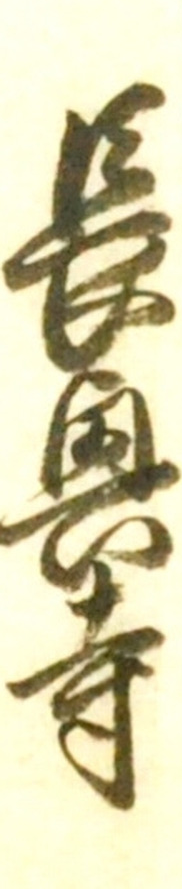長興寺

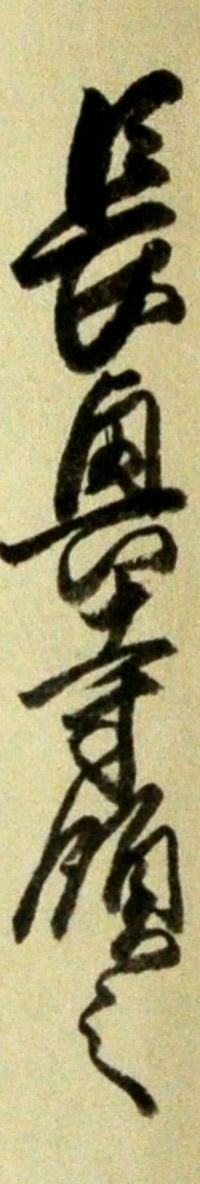長興寺領之
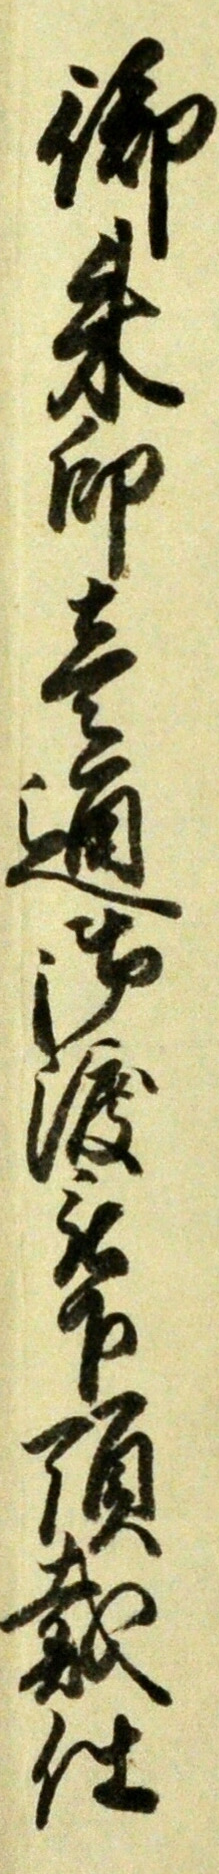御朱印壱通御渡被下頂戴仕
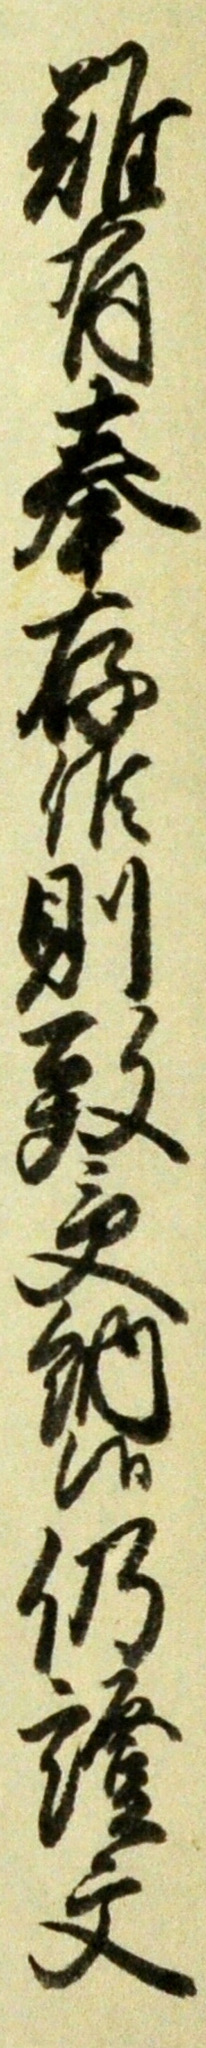難有奉存候則致受納候仍証文
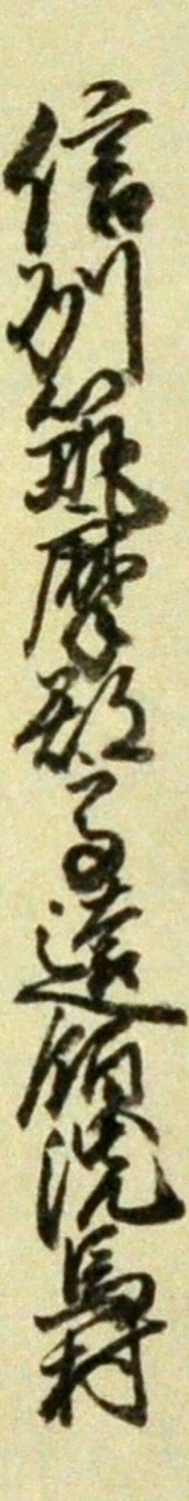信州筑摩郡高遠領洗馬村
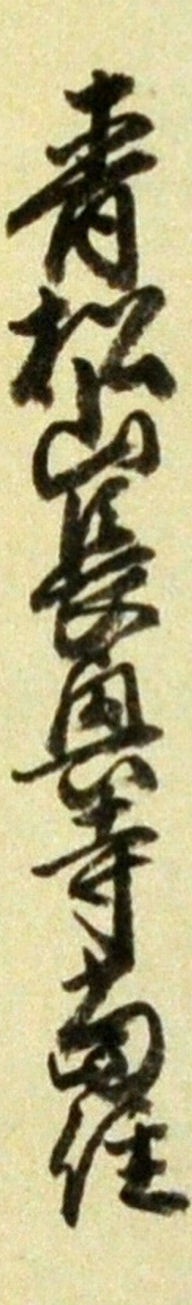青松山長興寺当住
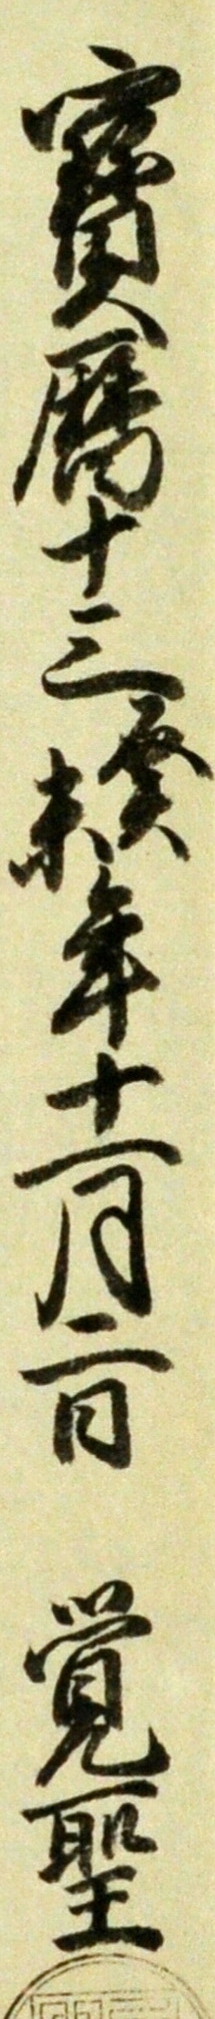宝暦十三癸未年十一月二日覚聖
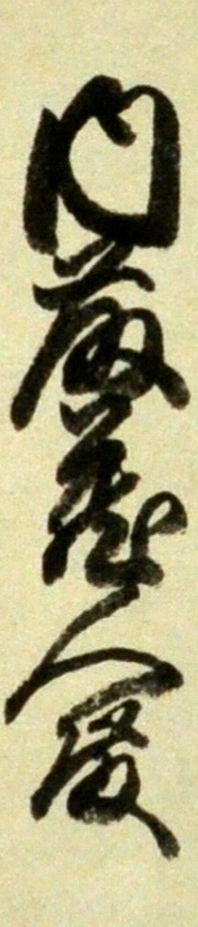内藤蔵人殿
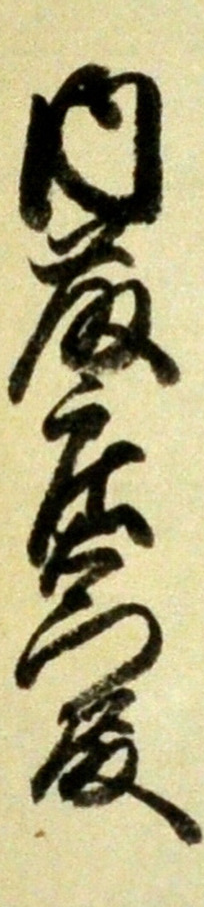内藤庄右衛門殿
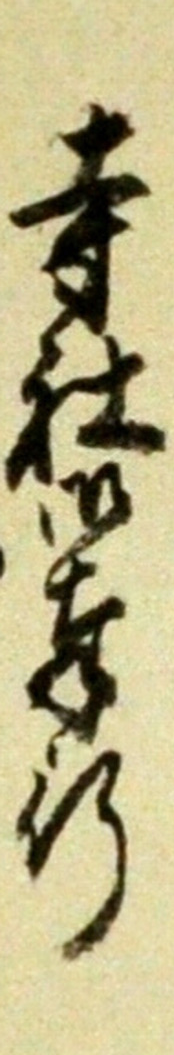寺社御奉行
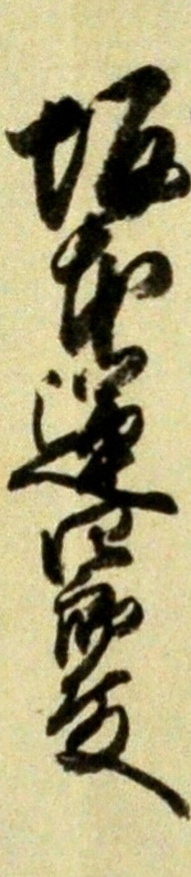坂本運四郎殿

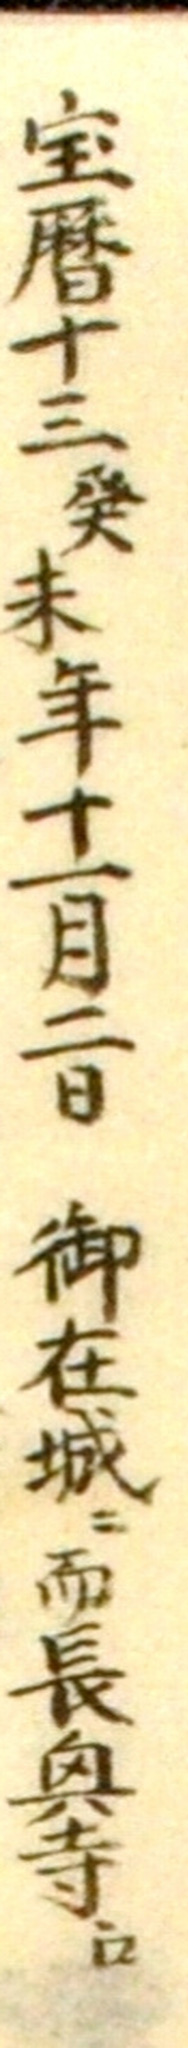宝暦十三癸未年十一月二日御在城ニ而長興寺江
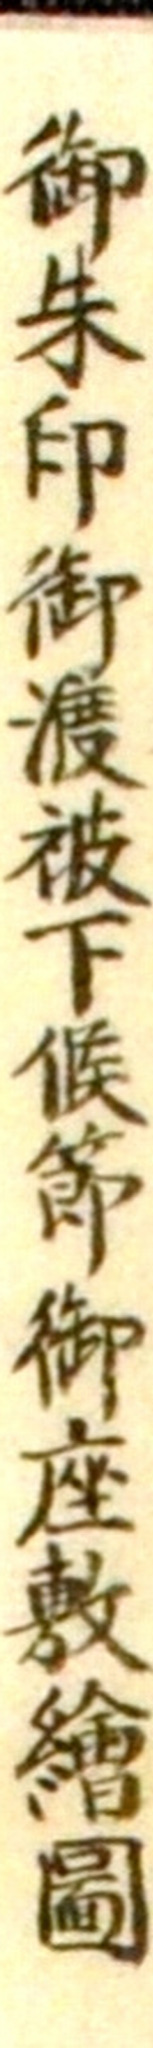御朱印御渡被下候節御座敷絵図
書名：証文
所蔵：伊那市立高遠町図書館・合同会社AMANE
